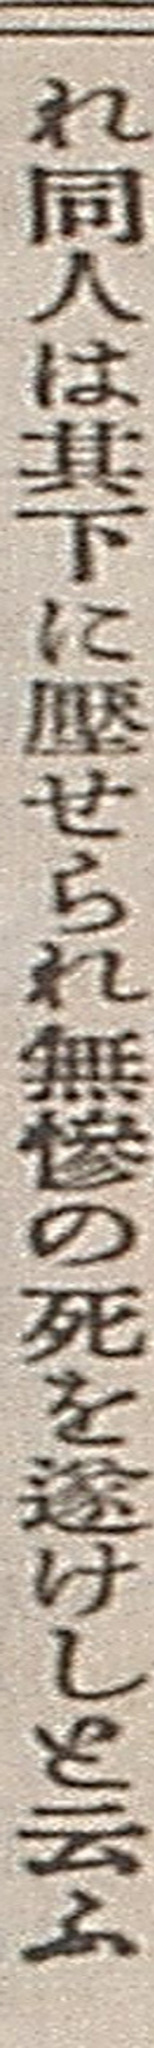れ同人は其下に圧せられ無惨の死を遂けしと云ふ
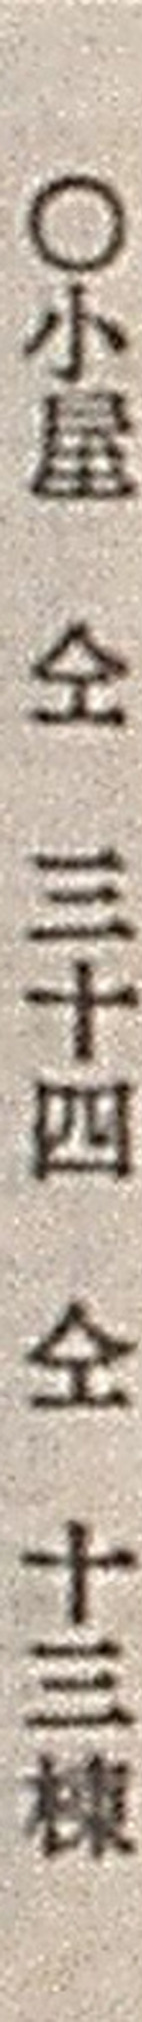〇小屋仝三十四仝十三棟
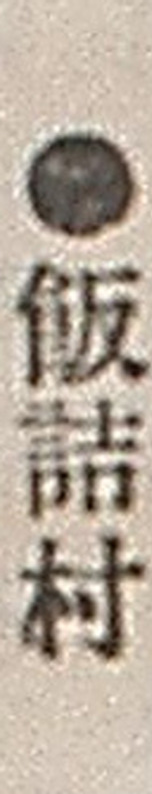●飯詰村
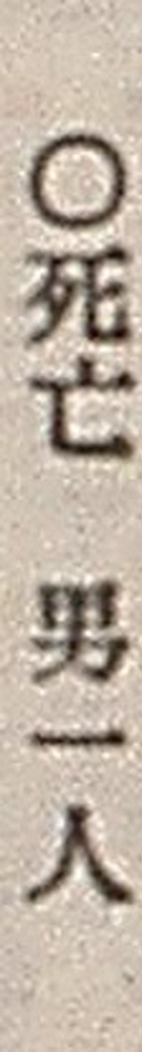〇死亡男一人
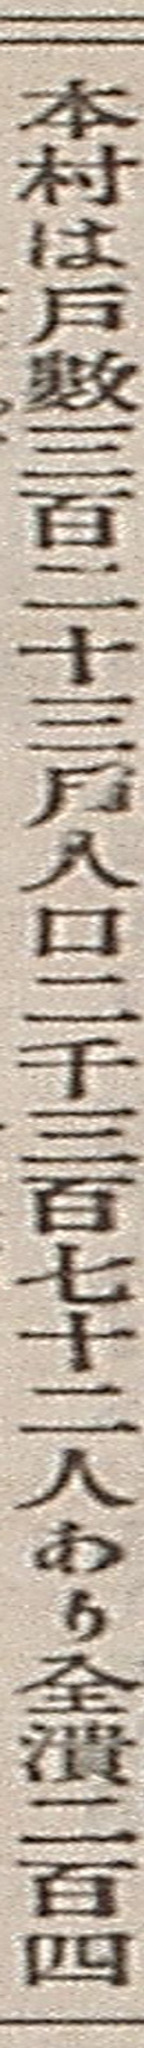本村は戸数三百二十三戸人口二千三百七十二人あり全潰二百四
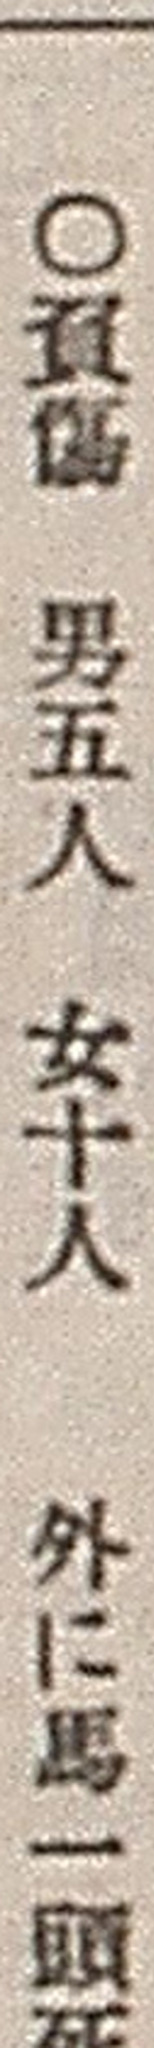〇負傷男五人女十人外に馬一頭死す
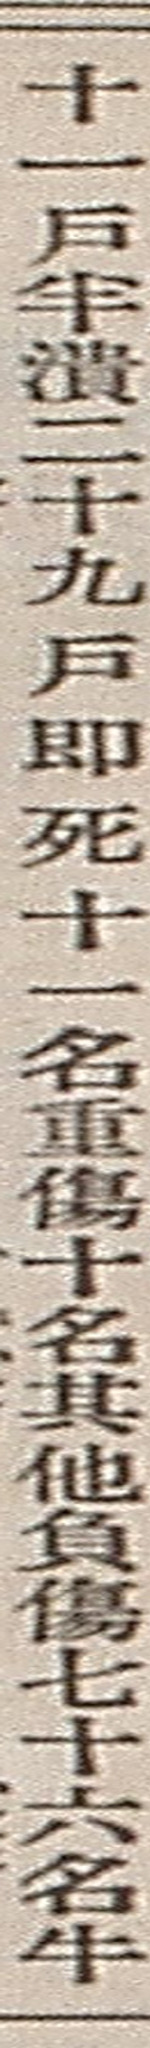十一戸半潰二十九戸即死十一名重傷十名其他負傷七十六名牛
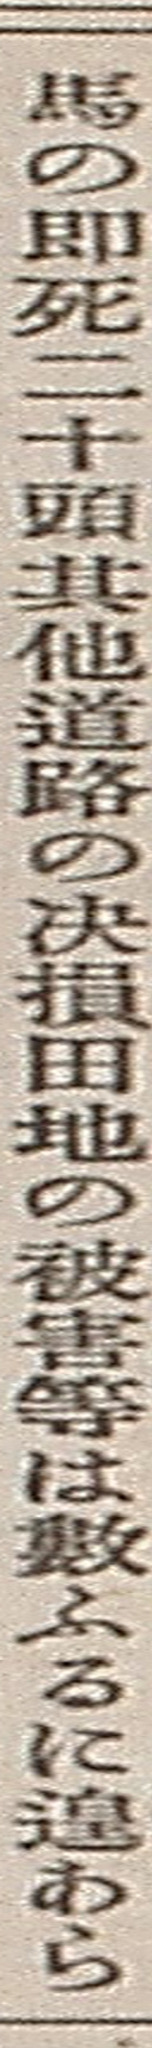馬の即死二十頭其他道路の决損田地の被害等は数ふるに遑あら
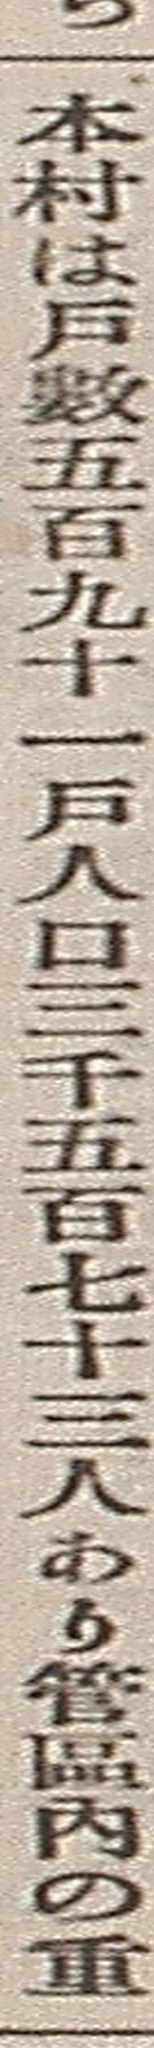本村は戸数五百九十一戸人口三千五百七十三人あり管区内の重
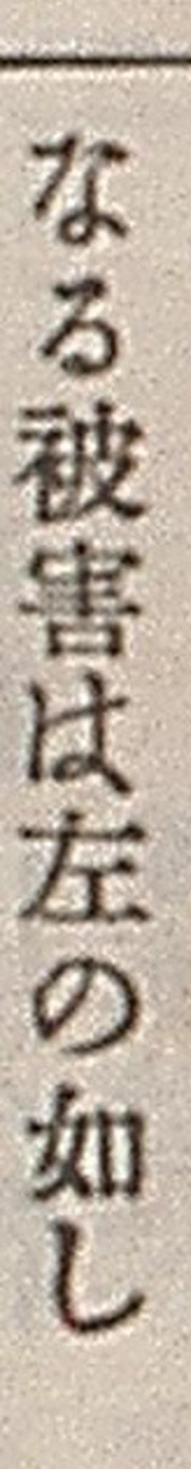なる被害は左の如し
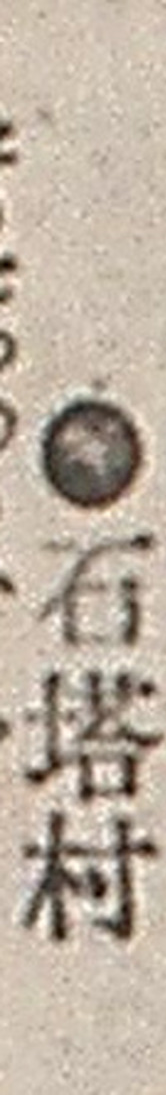●石塔村
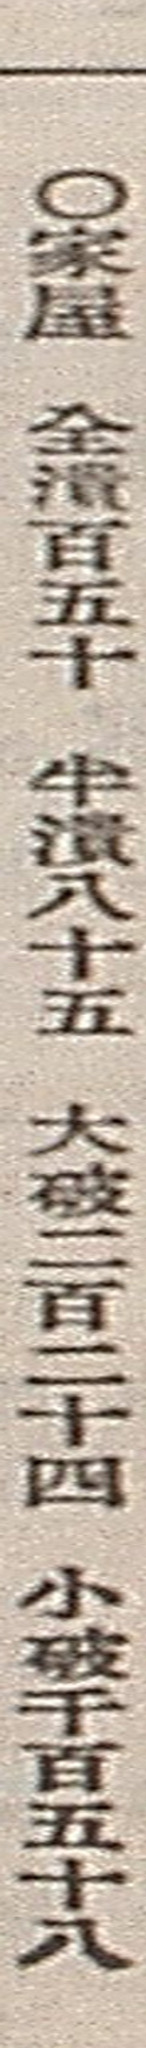〇家屋全潰百五十半潰八十五大破二百二十四小破千百五十八
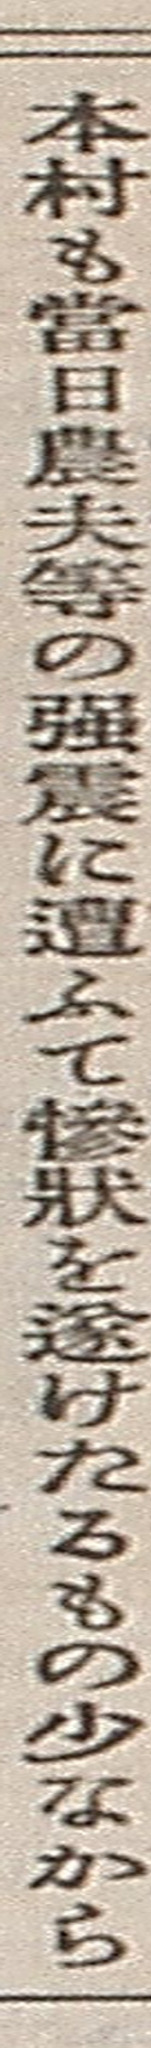本村も当日農夫等の強震に遭ふて惨状を遂けたるもの少なから
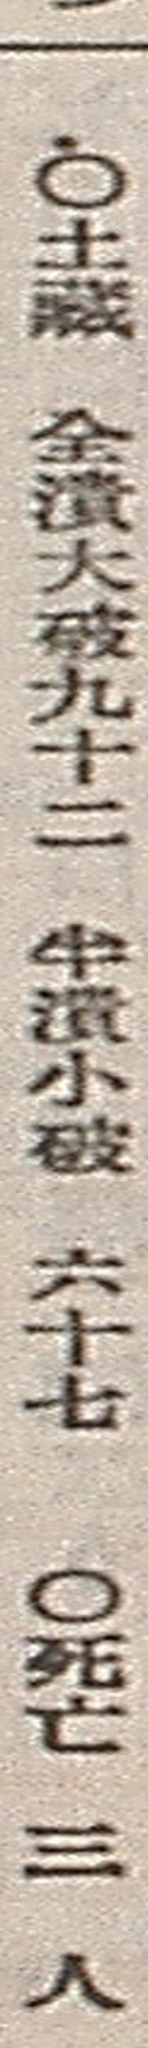〇土蔵全潰大破九十二半潰小破六十七〇死亡三人
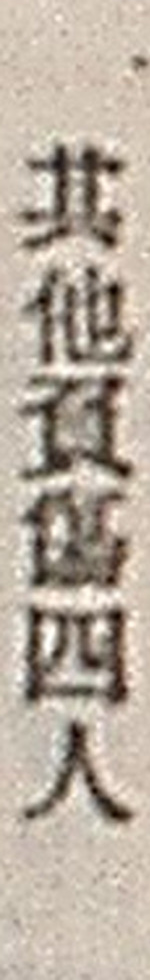其他負傷四人
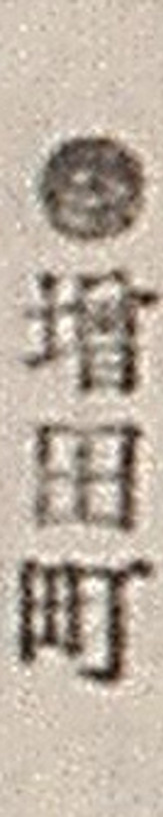●増田町
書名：風俗畫報臨時増刊第百二十四號　洪水地震被害録（上）
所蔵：東京大学地震研究所図書室 Earthquake Research Institute Library, The University of Tokyo, JAPAN
